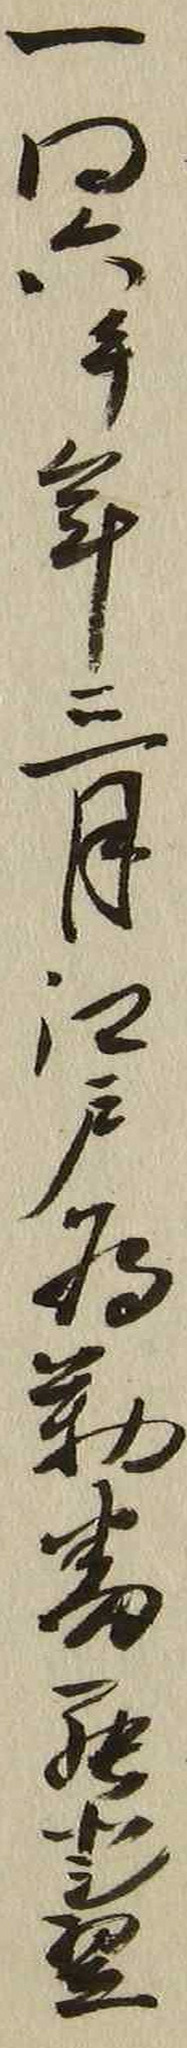一同六午年三月江戸為勤番罷登翌
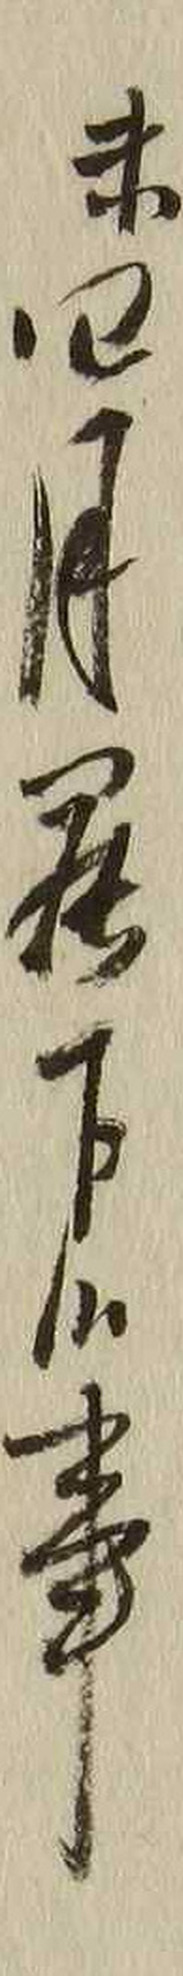未四月罷下候事
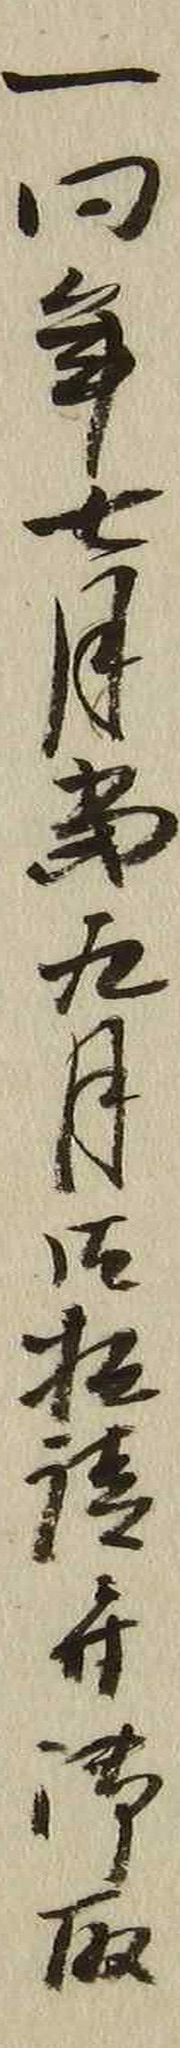一同年七月当九月御招請に付御取
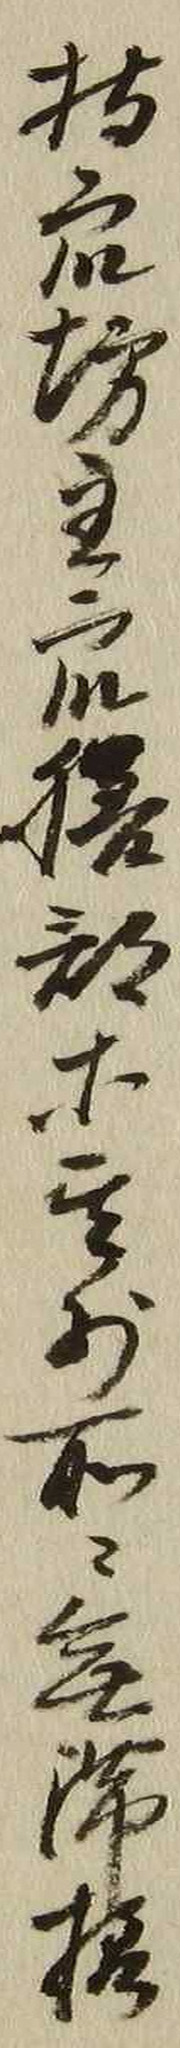持衆坊主衆膳部等其外諸々無滞様
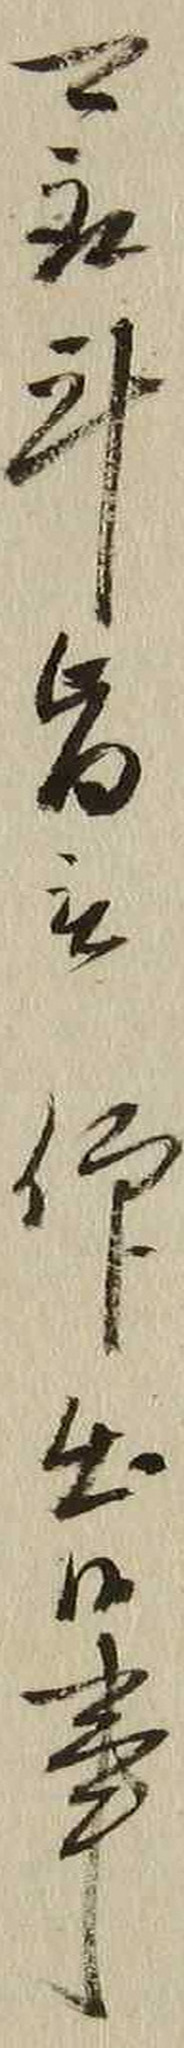可取計旨被仰出候事
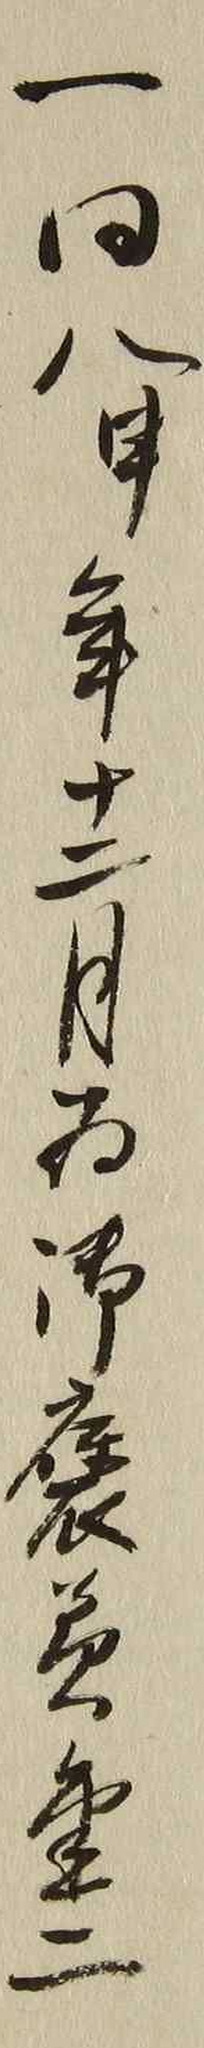一同八申年十二月為御褒美金二
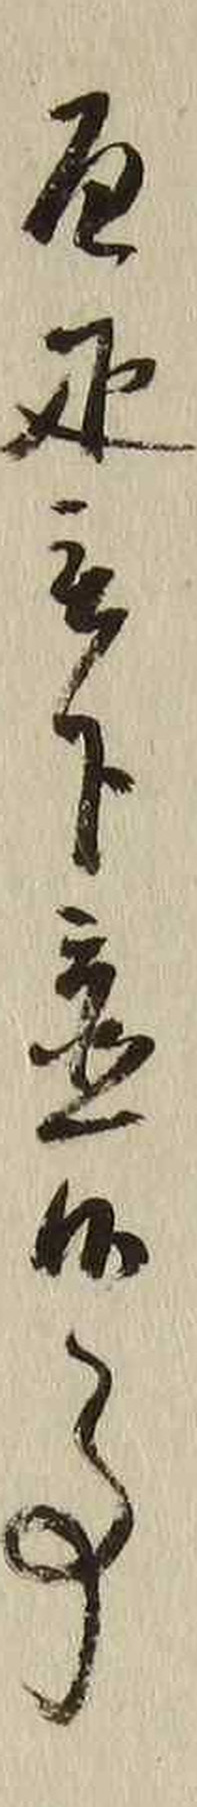百疋被下置候事
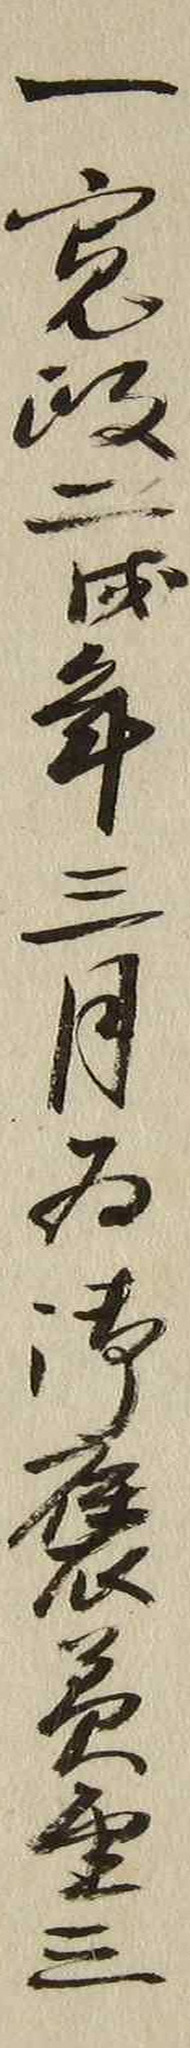一寛政二戌年三月為御褒美金三
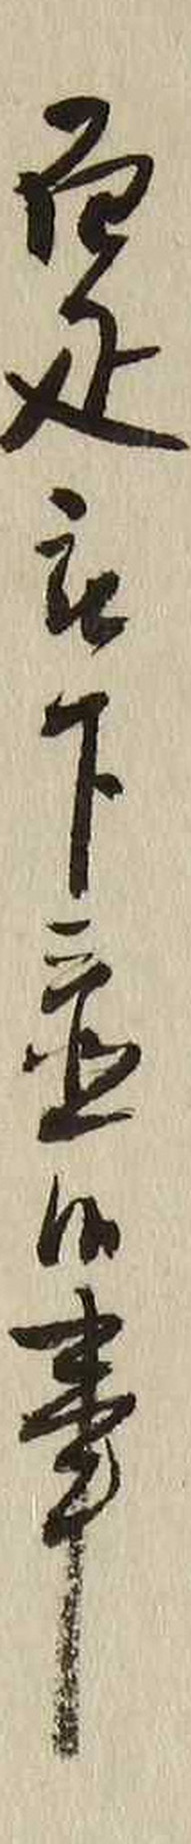百疋被下置候事
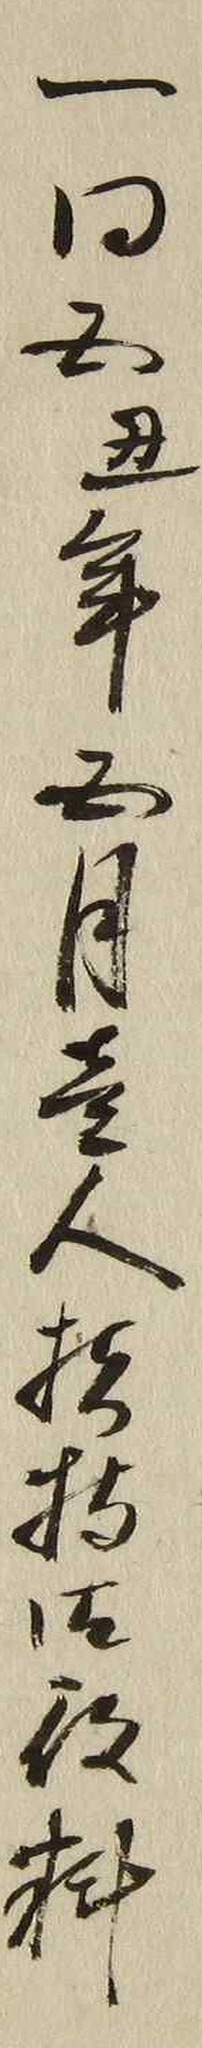一同五丑年五月壱人扶持御役料
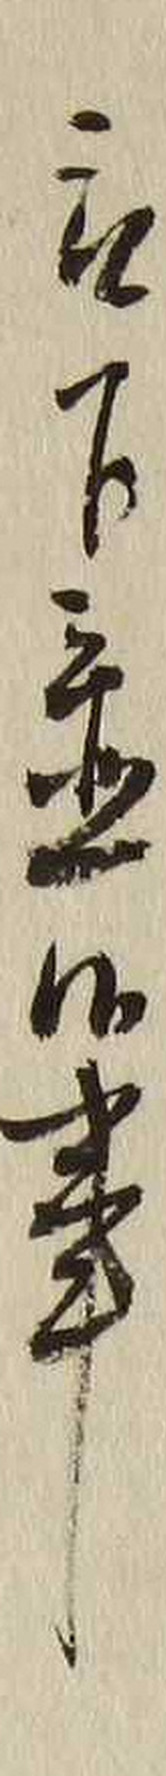被下置候事
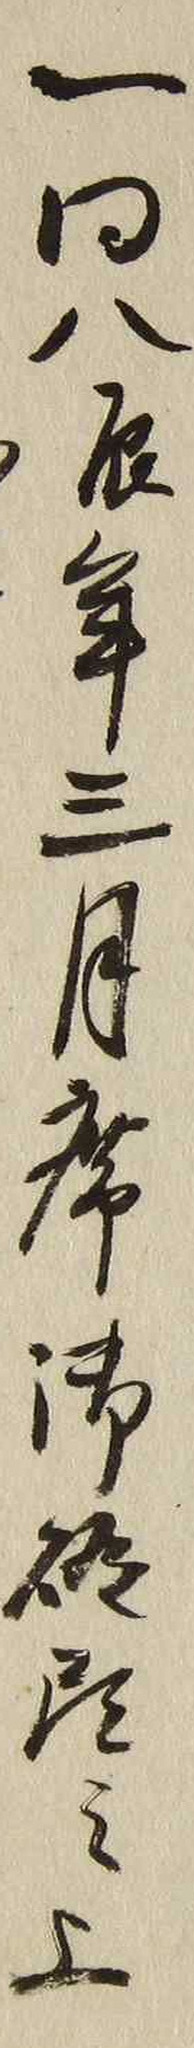一同八辰年三月席御膳頭之上
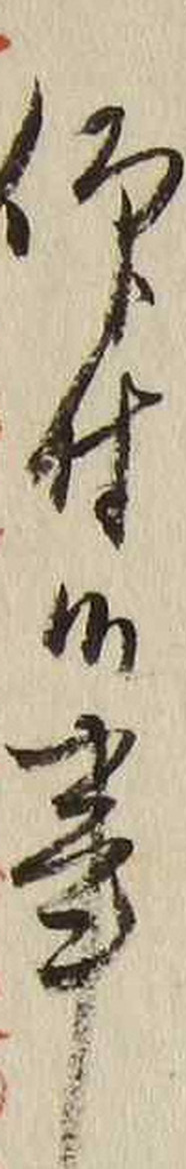仰付候事
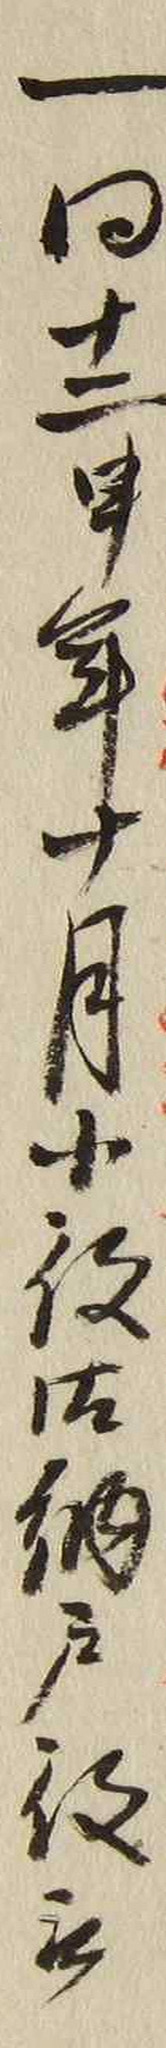一同十二申年十月小役御納戸役被
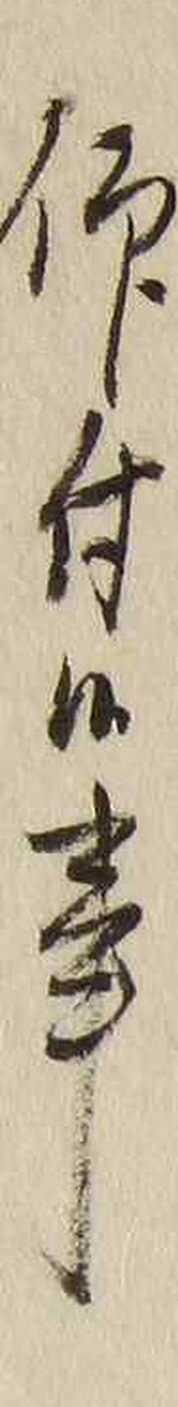仰付候事

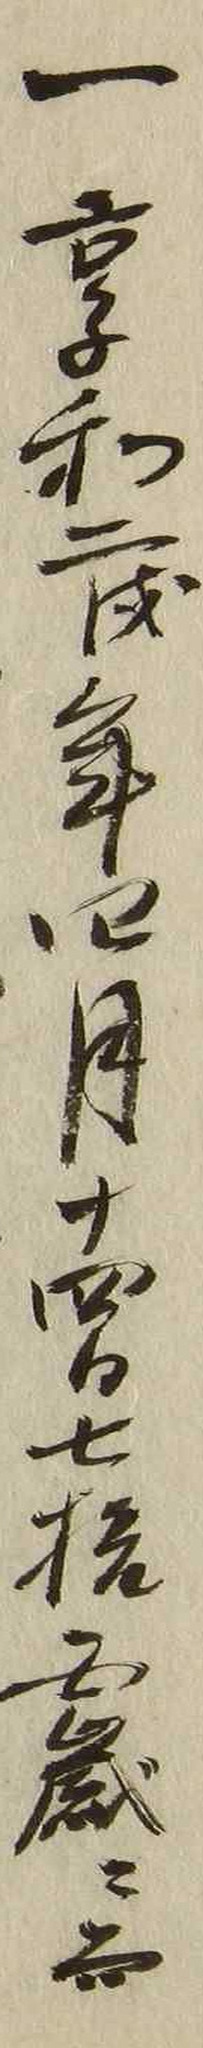一享和二戌年四月十四日七拾五歳に而
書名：諸士系譜　巻之360　す之部10
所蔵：会津若松市立会津図書館
